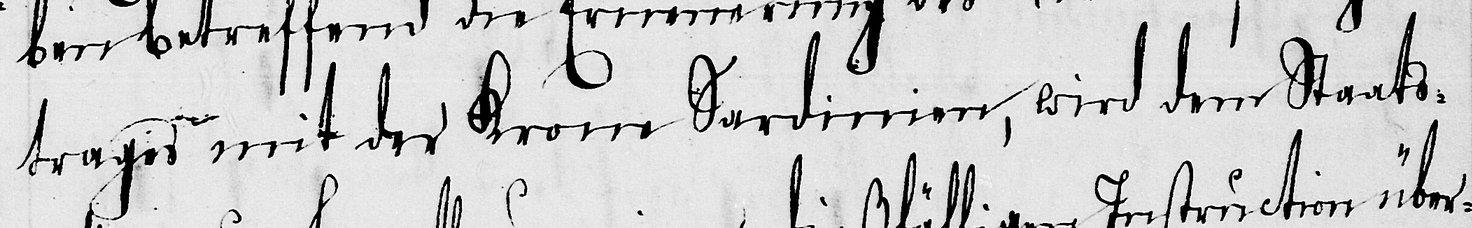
trages mit der Krone Sardinien, wird dem Staats¬
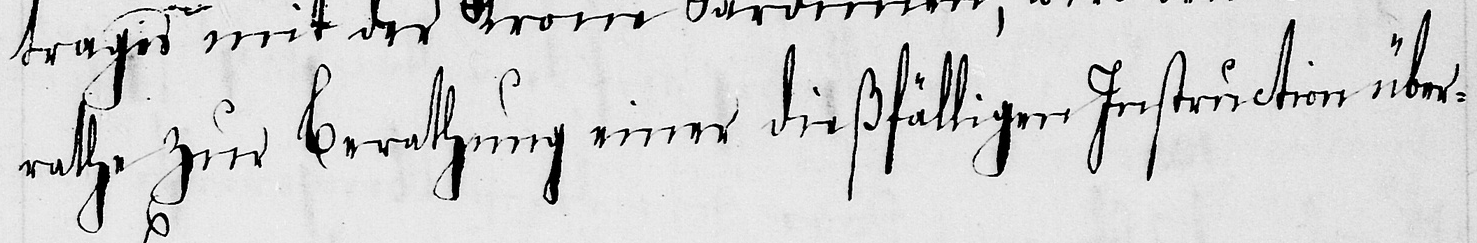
rathe zur Berathung einer dießfälligen Instruction über¬
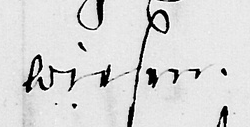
wiesen.
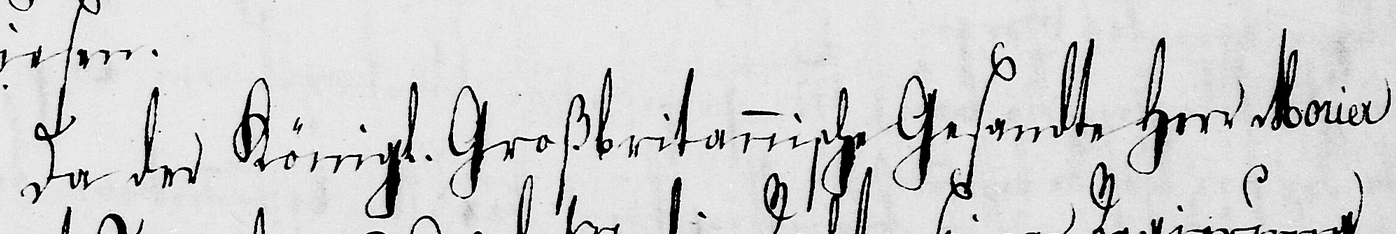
Da der Königl. Großbritannische Gesandte Herr Morier
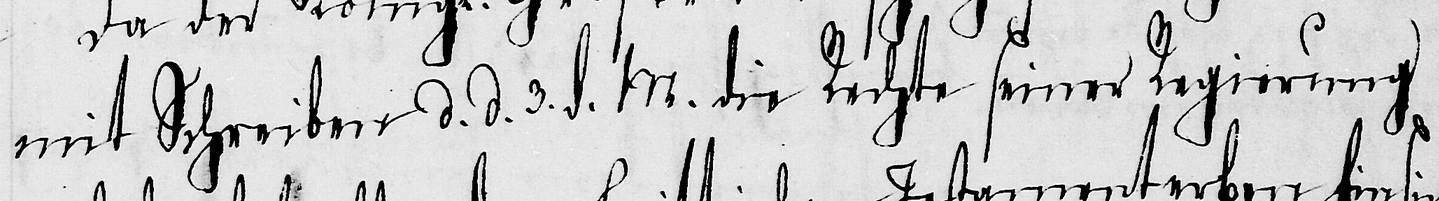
mit Schreiben d. d. 3. d. M. die Rechte seiner Regierung
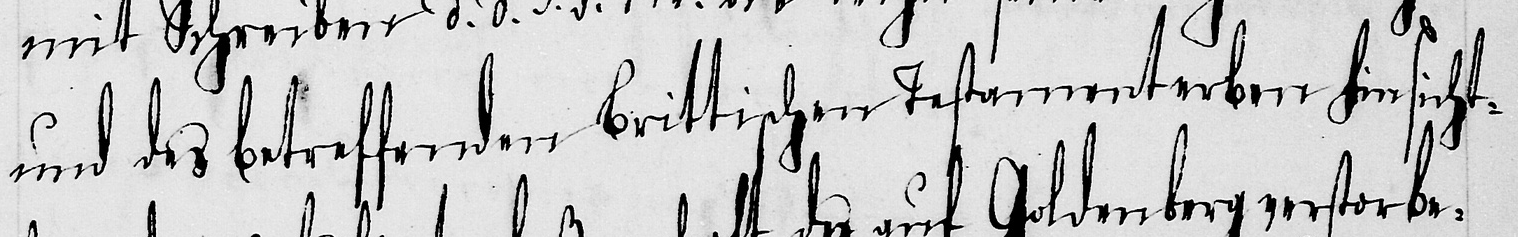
und des betreffenden Brittischen Testamenterben hinsicht¬
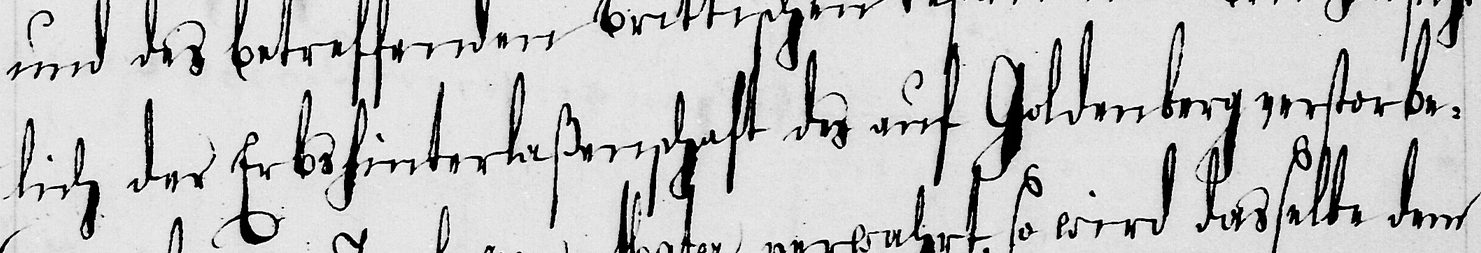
ch der Erbshinterlaßenschaft des auf Goldenberg verstor¬
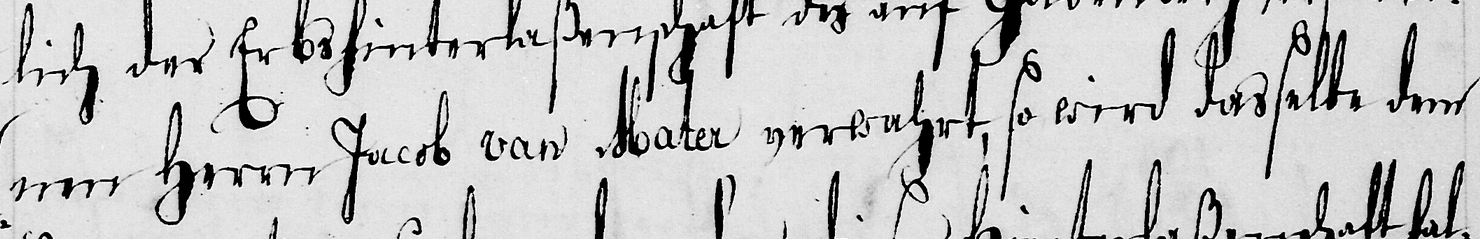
nen Herrn Jacob van Mater verwahrt, so wird dasselbe dem
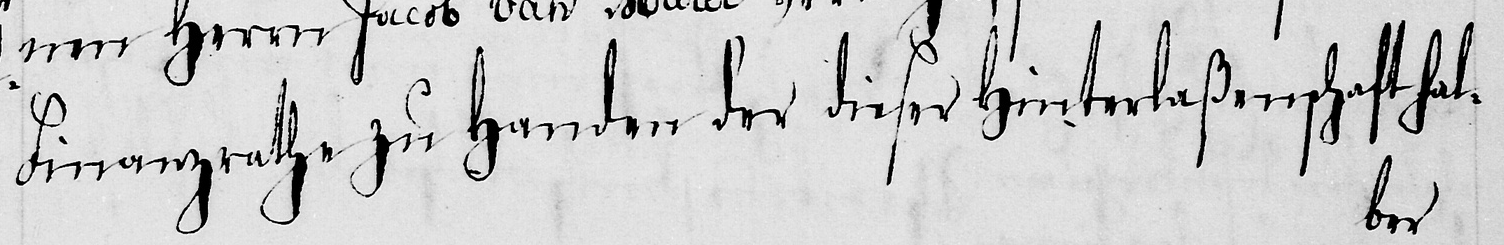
Finanzrathe zu Handen dieser Hinterlaßenschaft ha¬
